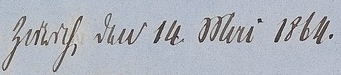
Zürich, den 14. Mai 1864.
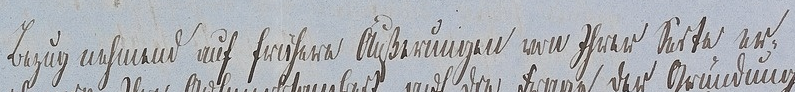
Bezug nehmend auf frühere Äußerungen von Ihrer Seite er-
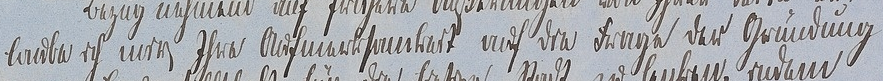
laube ich mir, Ihre Aufmerksamkeit auf die Frage der Gründung
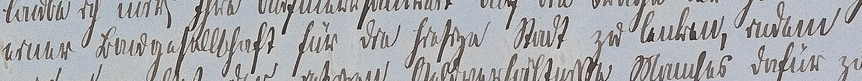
einer Baugesellschaft für die hiesige Stadt zu lenken, indem
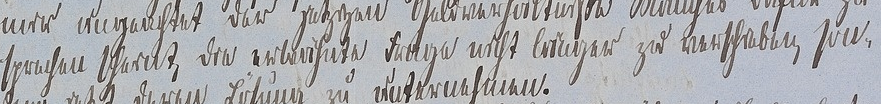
sprechen scheint, die erwähnte Frage nicht länger zu verschieben, son-
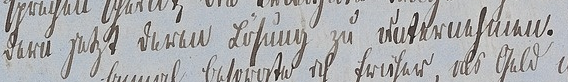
dern jetzt deren Lösung zu unternehmen.
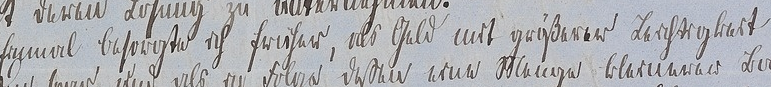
Einmal besorgte ich früher, als Geld mit größerer Leichtigkeit
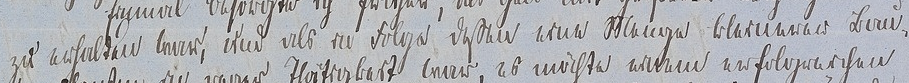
zu erhalten war, und als in Folge dessen eine Menge kleinerer Bau-
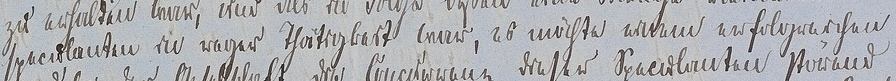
speculanten in reger Thätigkeit war, es möchte einem erfolgreichen
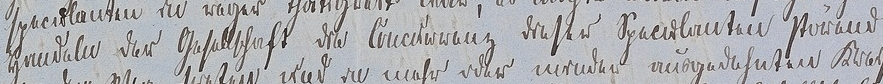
Handeln der Gesellschaft die Concurrenz dieser Speculanten störend
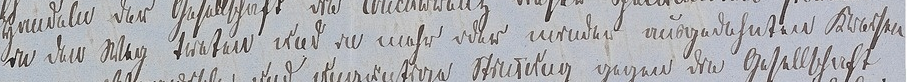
in den Weg treten und in mehr oder minder ausgedehnten Kreisen
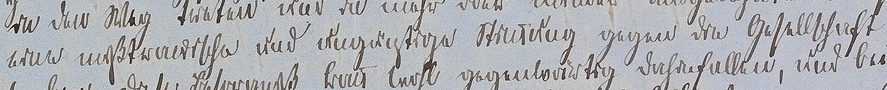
eine mißtrauische und ungünstige Stimmung gegen die Gesellschaft
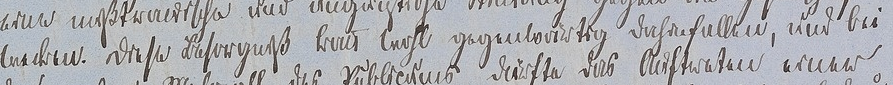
wecken. Diese Besorgniß kann wohl gegenwärtig dahinfallen, und bei
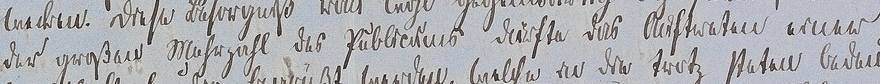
der großen Mehrzahl des Publicums dürfte das Auftreten einer
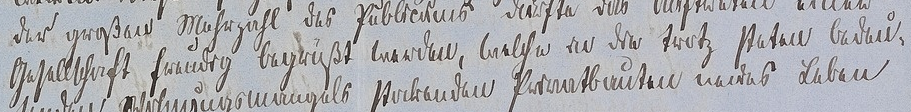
Gesellschaft freudig begrüßt werden, welche in die trotz steten bedeu-
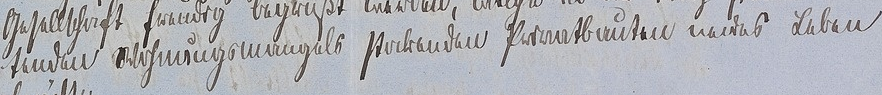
tenden Wohnungsmangels stockenden Privatbauten neues Leben
